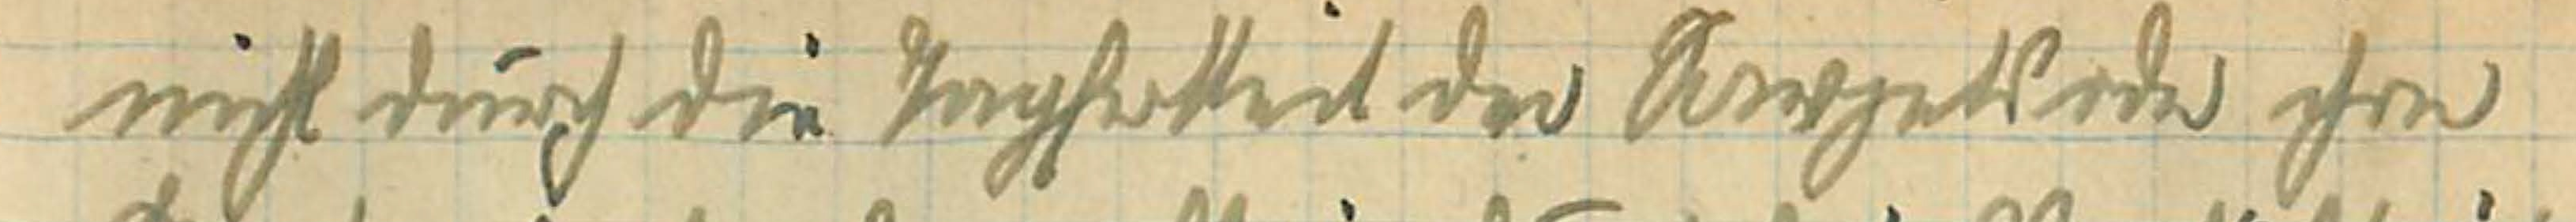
nicht durch die Tapferkeit der Sowjets oder ihrer
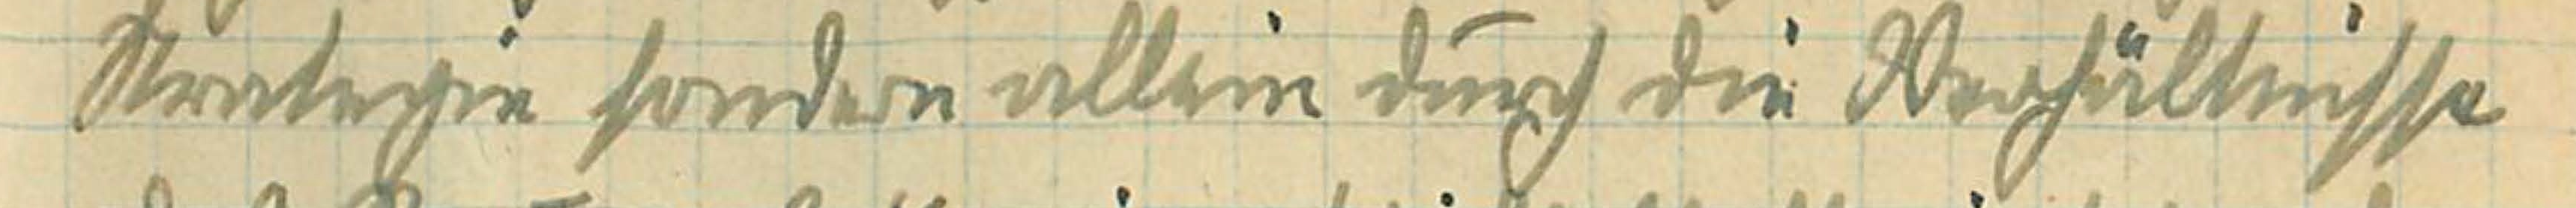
Strategie sondern allein durch die Verhältnisse
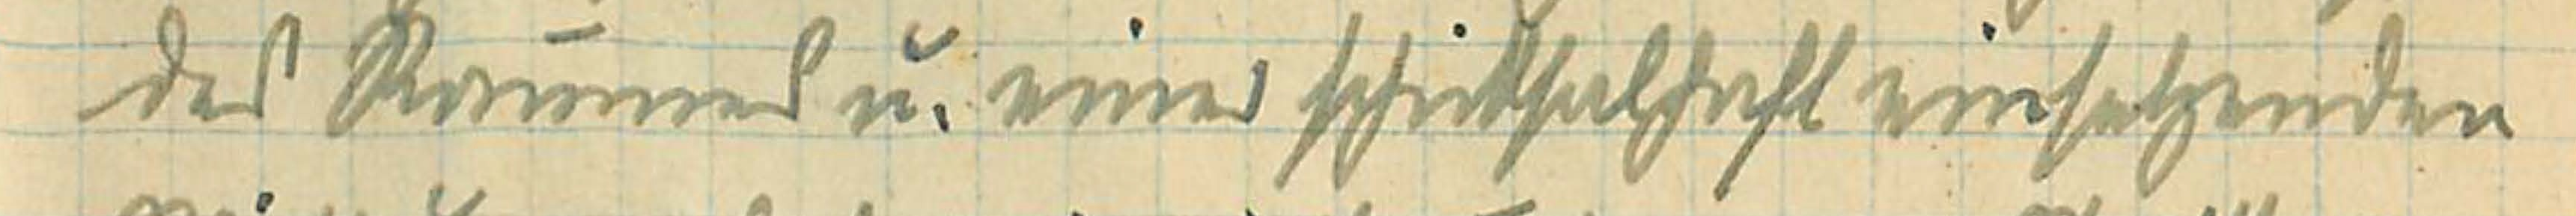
des Raumes u. einer schicksalhaft einsetzenden
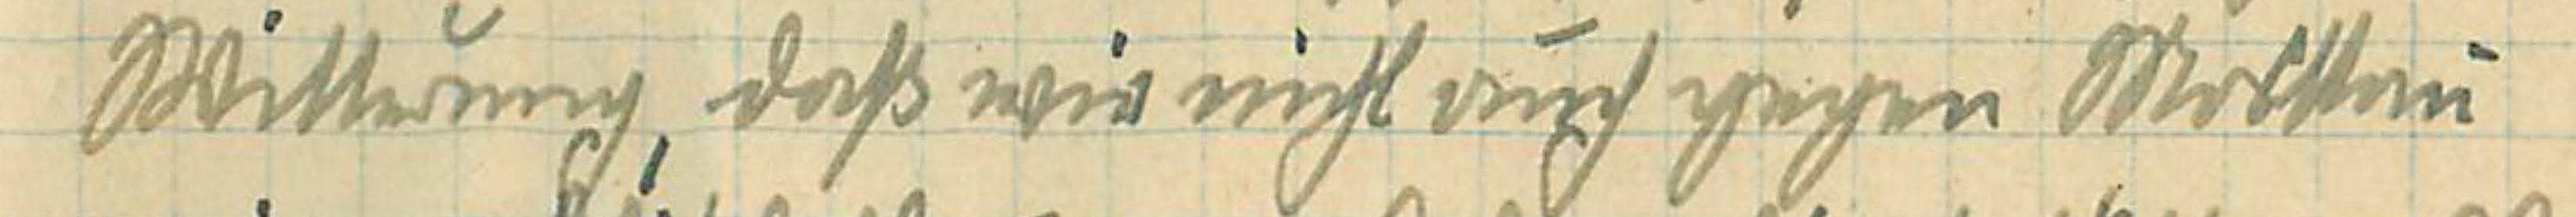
Witterung, daß wir nicht auch gegen Moskau
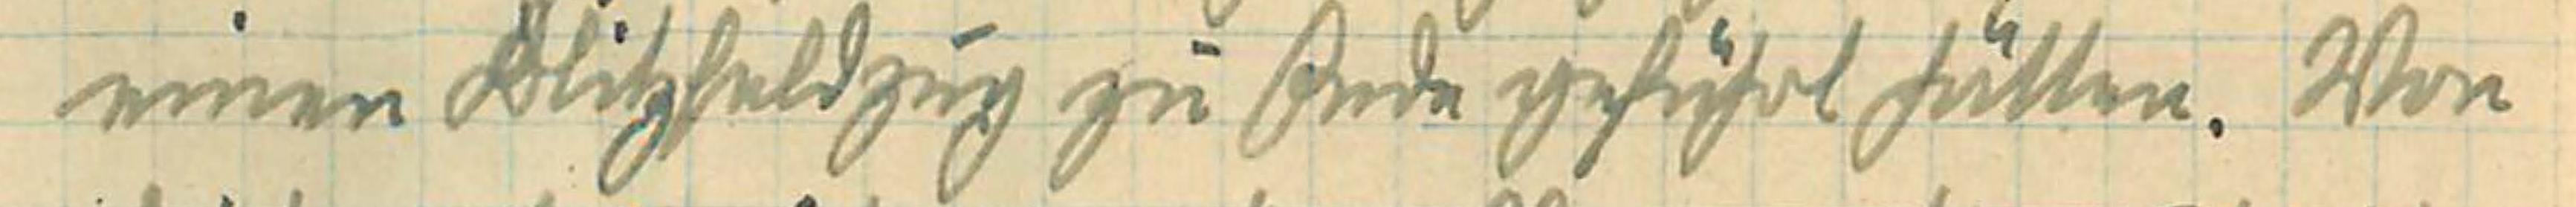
einen Blitzfeldzug zu Ende geführt hätten. Von
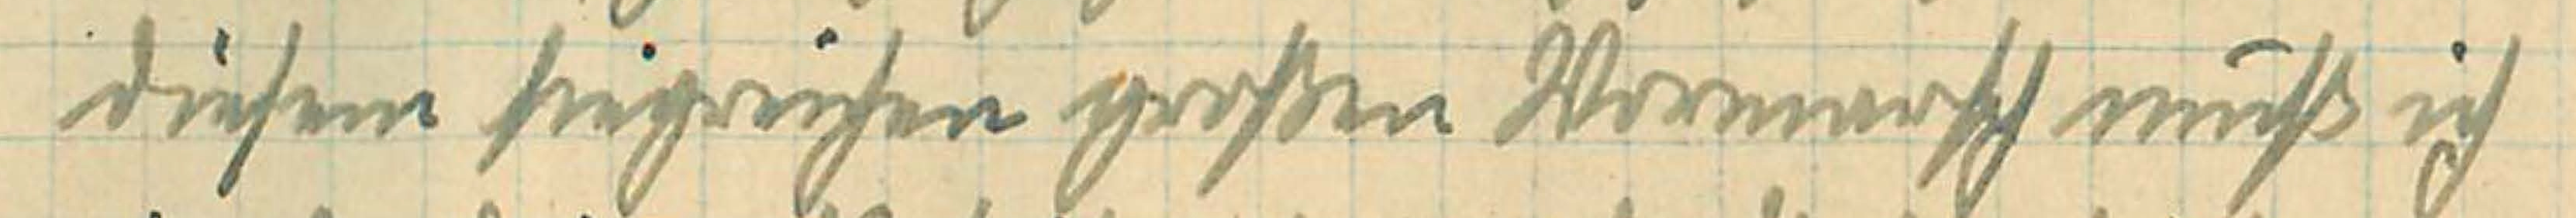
diesem siegreichen großen Vormarsch muß ich
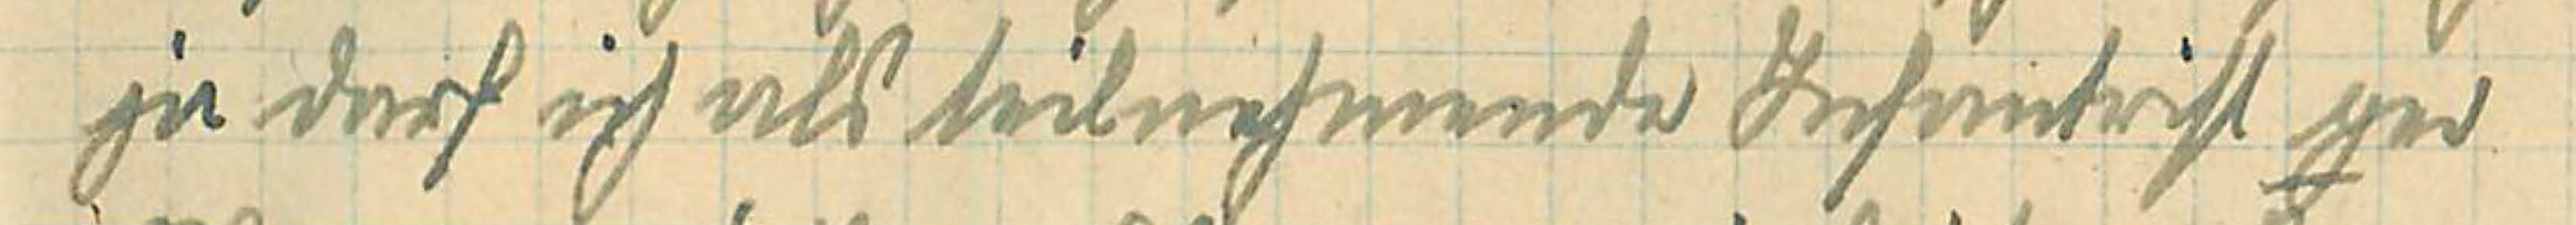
ja darf ich als teilnehmender Infantrist per
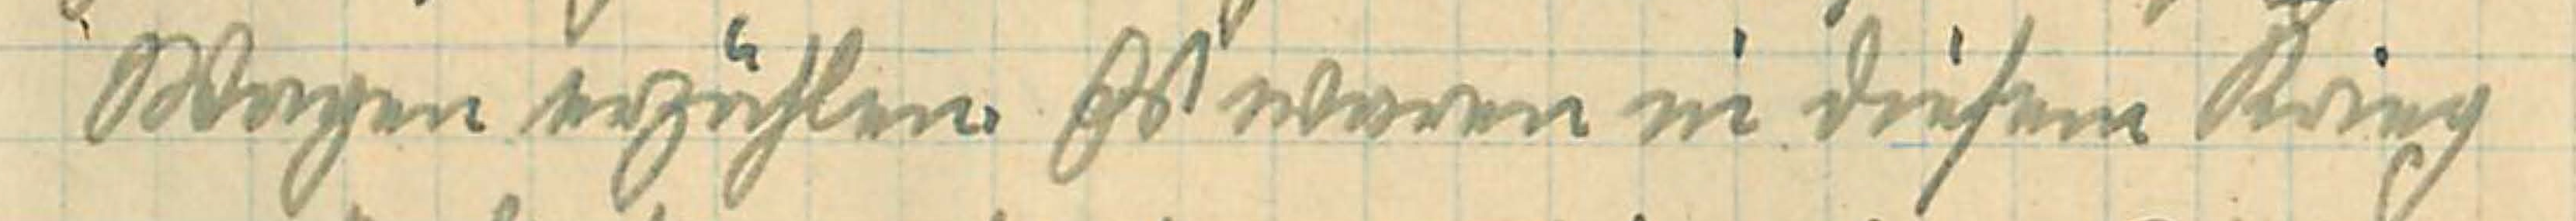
Wagen erzählen. Es waren in diesem Krieg
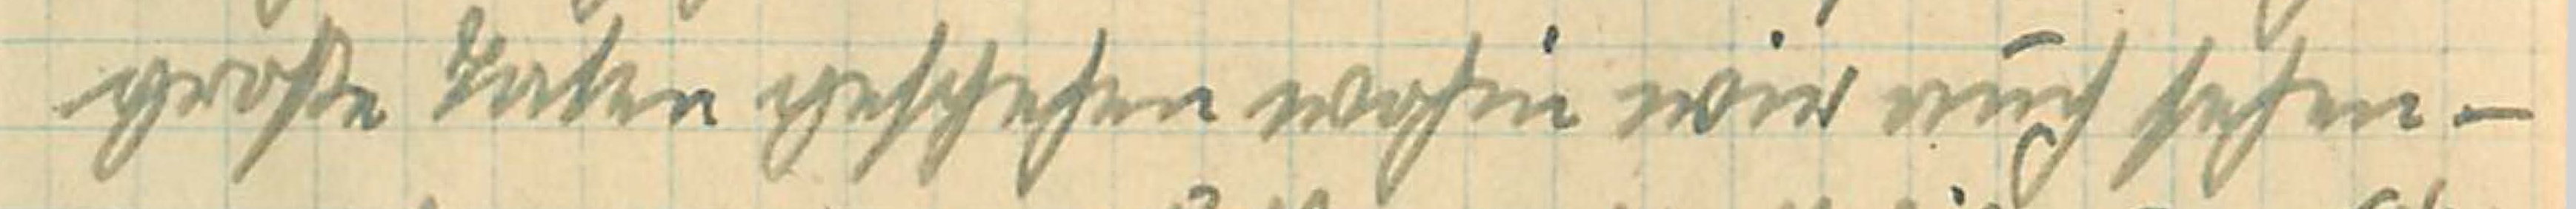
große Taten geschehen wohin wir auch sehen –
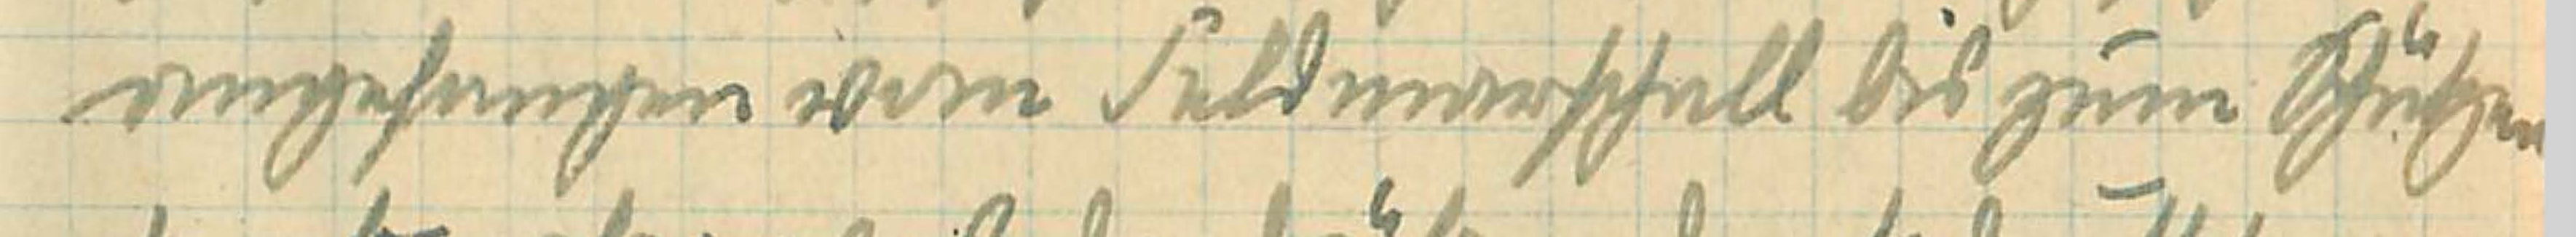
angefangen vom Feldmarschall bis zum Schützen
